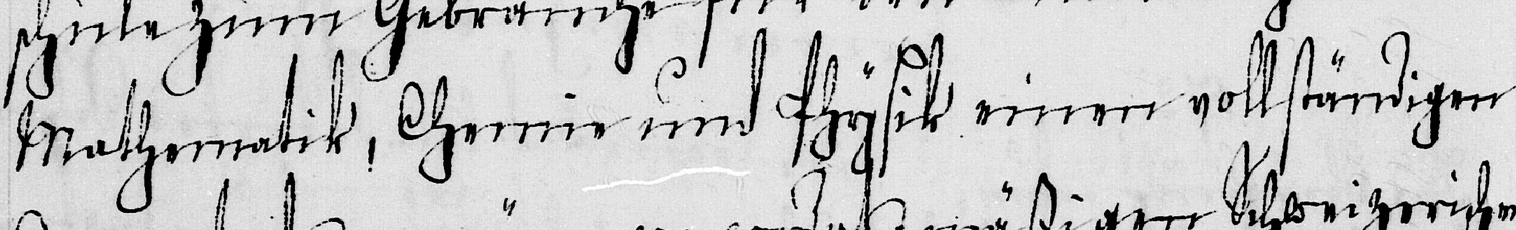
Mathematik, Chemie und Physik einen vollständigen
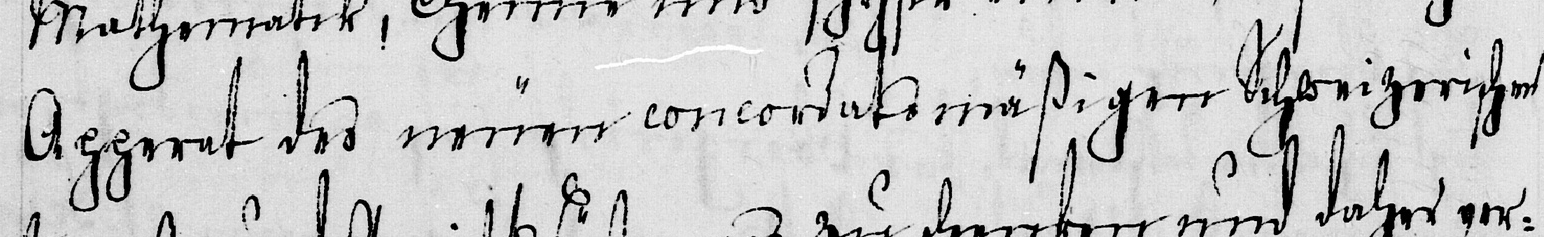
Apparat des neuen concordatsmäßigen Schweizerischen
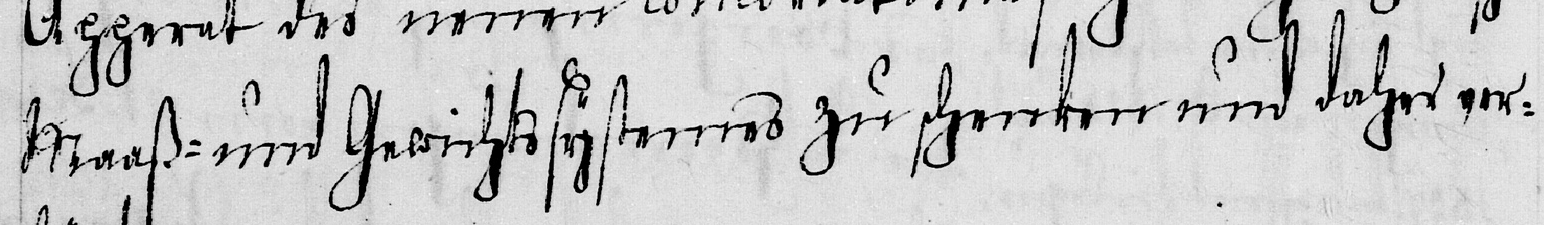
Maaß- und Gewichtssystemes zu schenken und daher ver¬
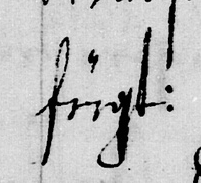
fügt:
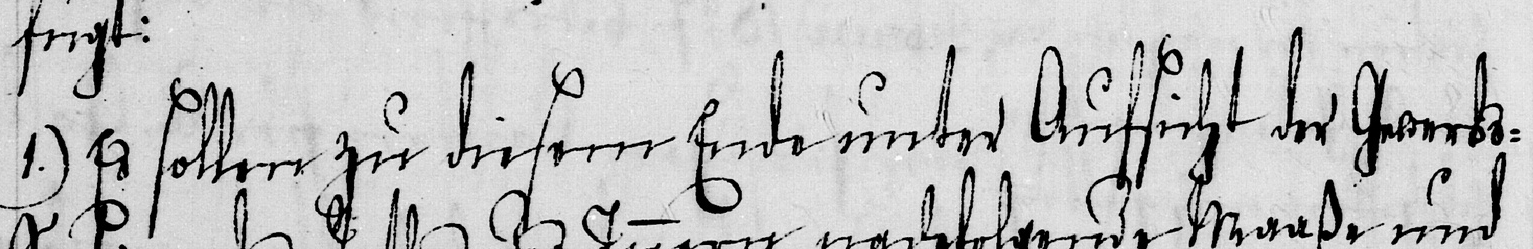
Es sollen zu diesem Ende unter Aufsicht der Gewerb¬
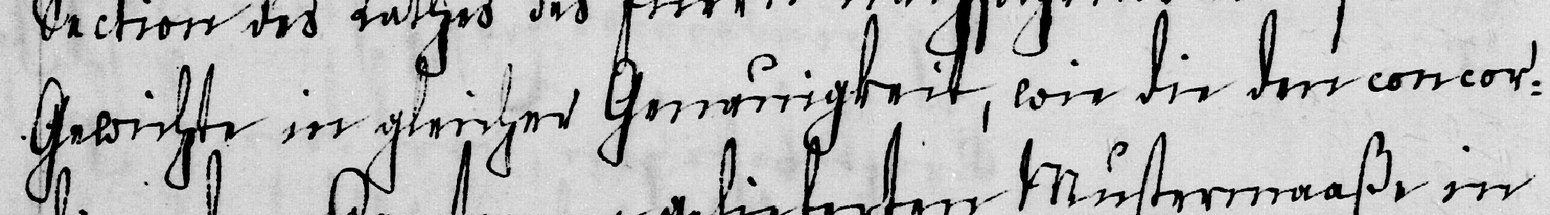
Gewichte in gleicher Genauigkeit, wie die den concor¬
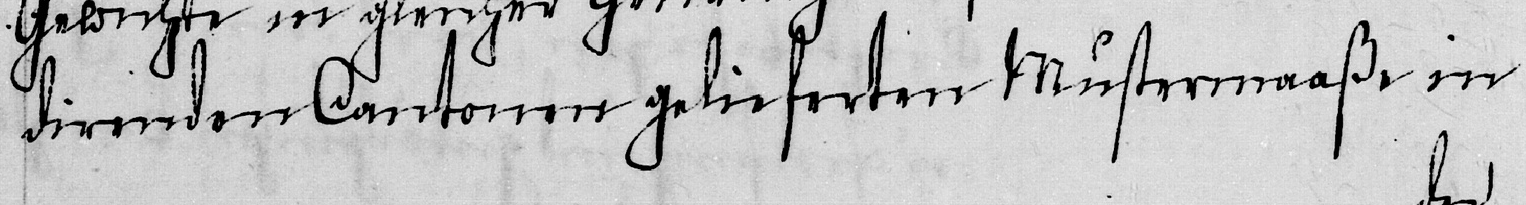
direnden Cantonen gelieferten Mustermaaße in
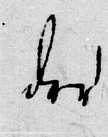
des
